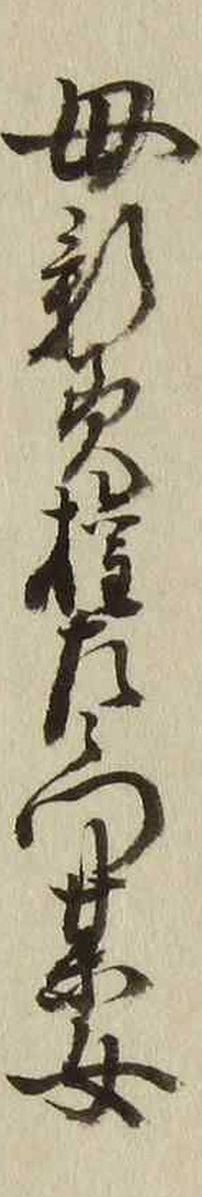母新美権左衛門某女
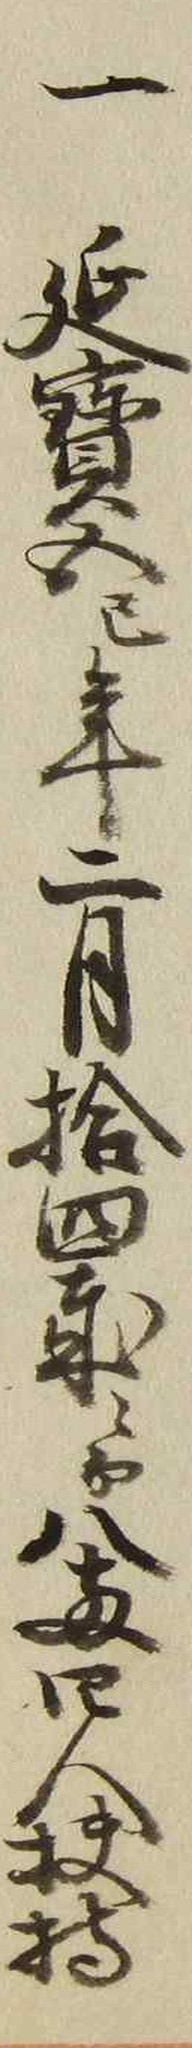一延宝五巳年二月拾四歳ニ而八両四人扶持
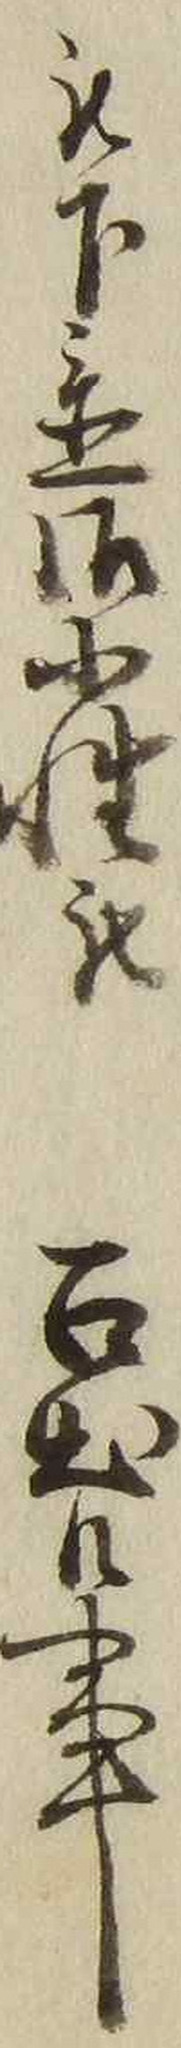被下置御小性被召出候事
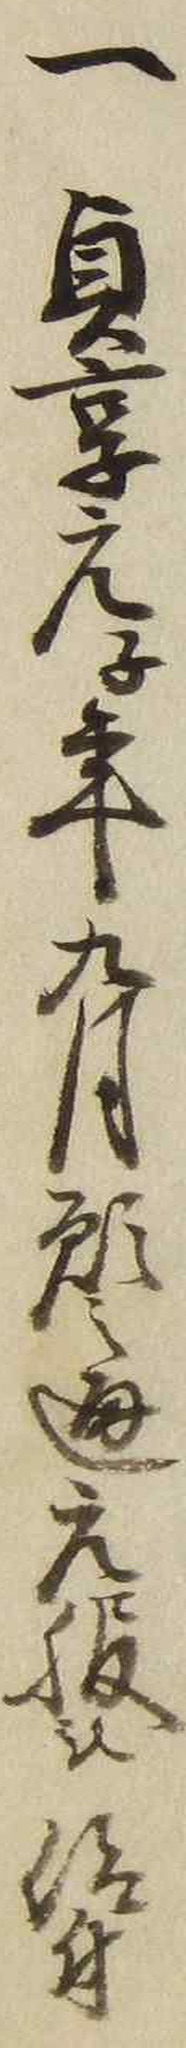一貞享元子年九月願之通元服被仰付

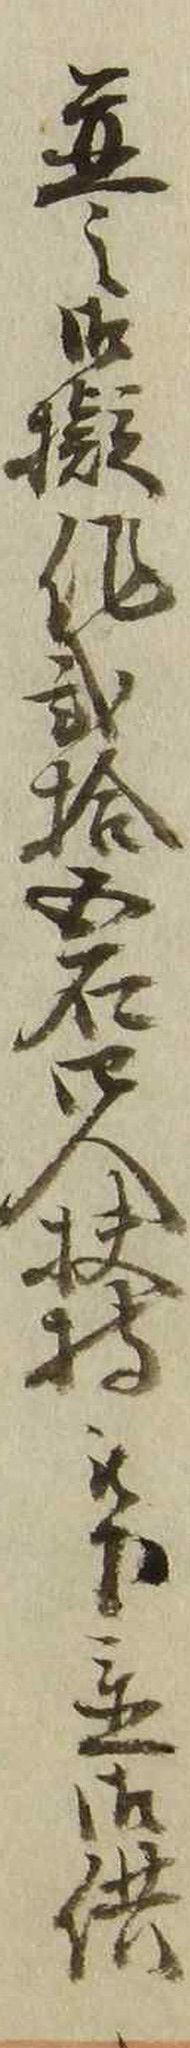並之御擬作弐拾五石四人扶持被下置御供
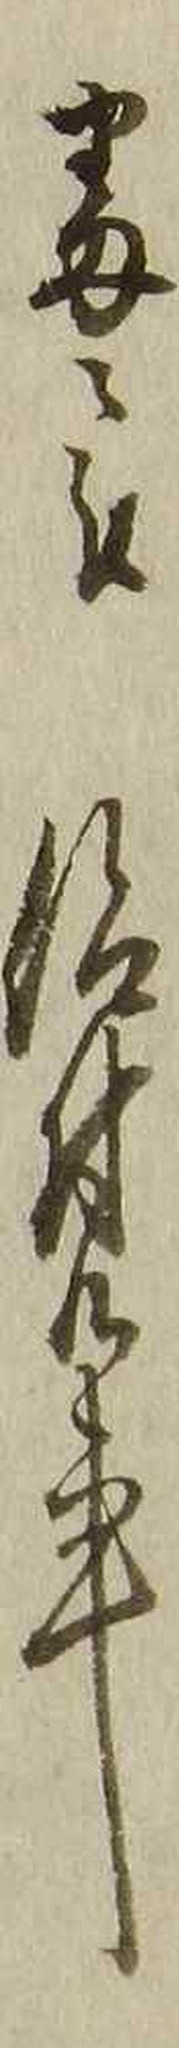番ニ被仰付候事
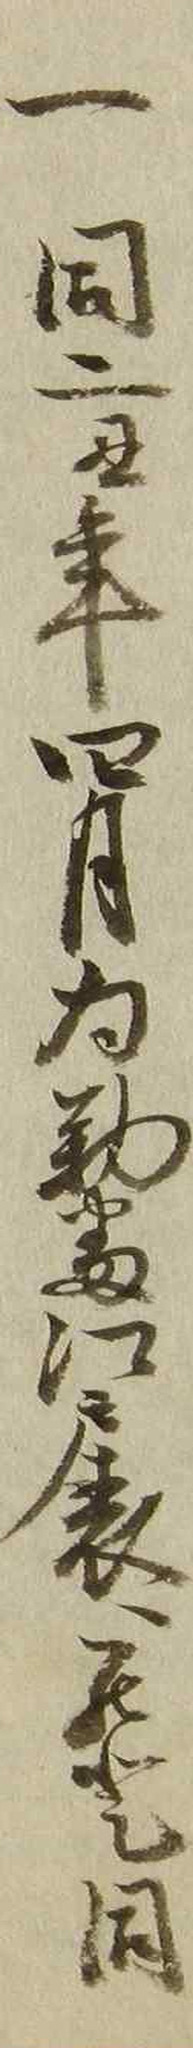一同二丑年四月為勤番江戸表へ罷登同
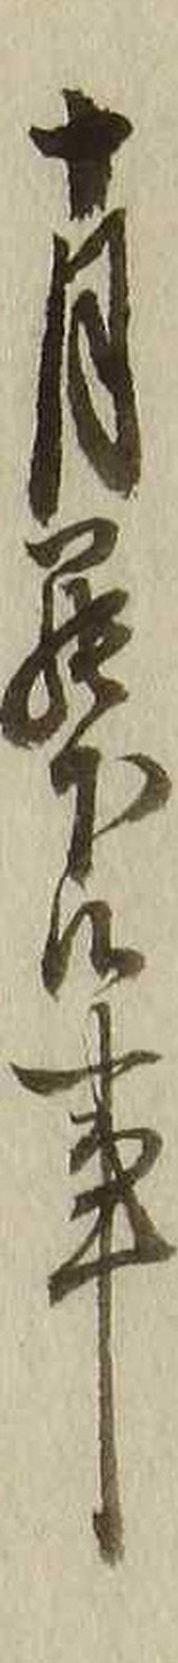十月罷下候事
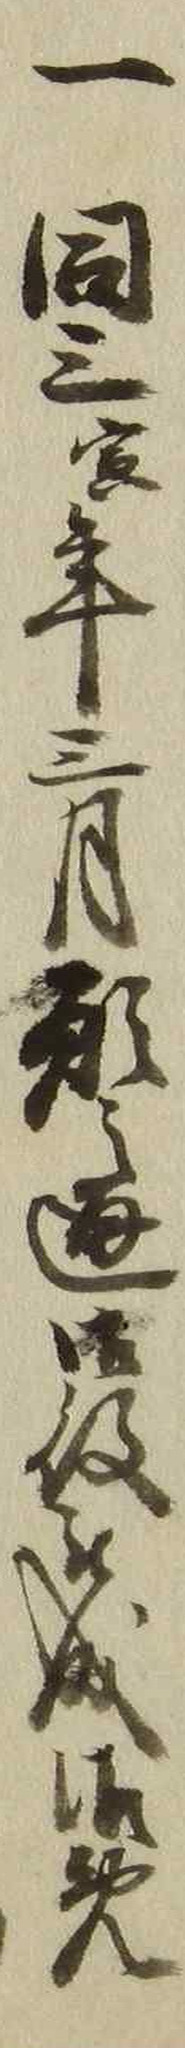一同三寅年三月願之通御役被成御免
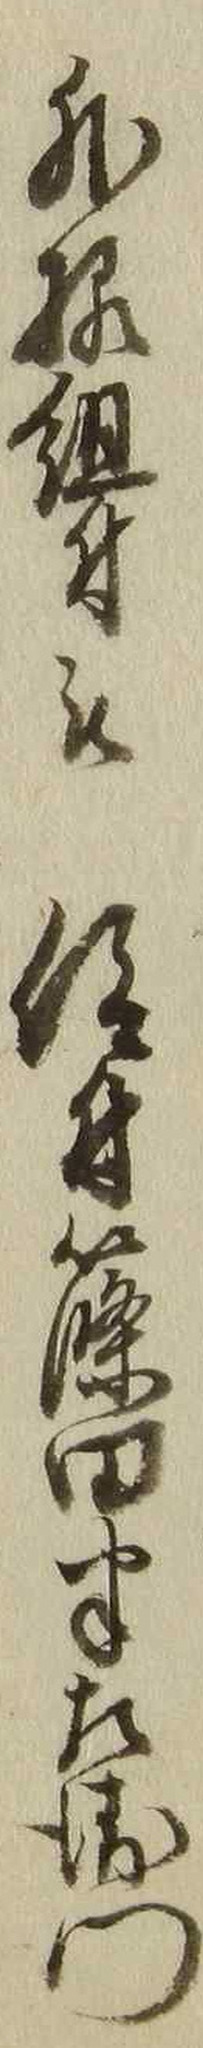外様組付被仰付篠田半左衛門
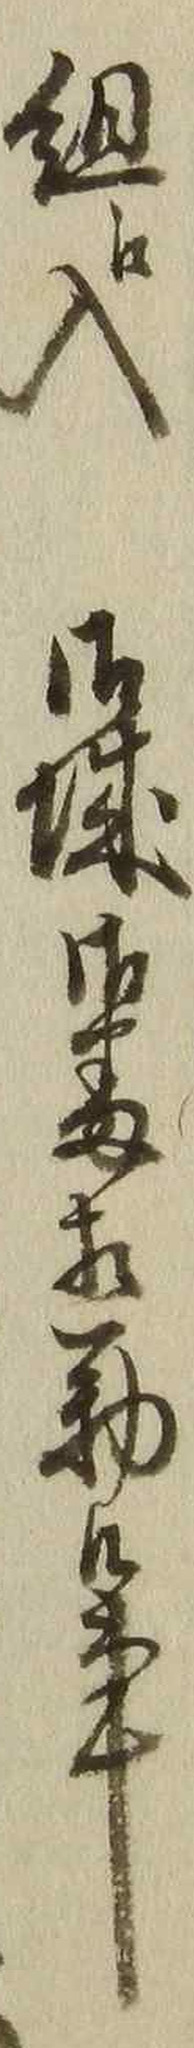組江入御城御番相勤候事
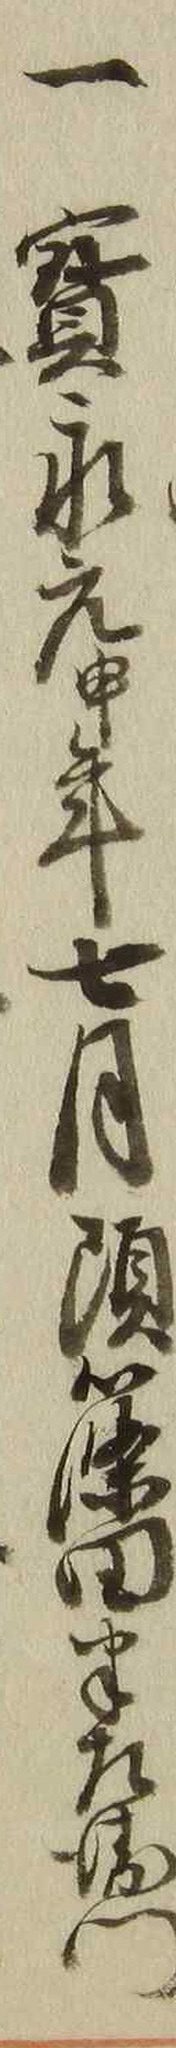一宝永元申年七月頭篠田半左衛門
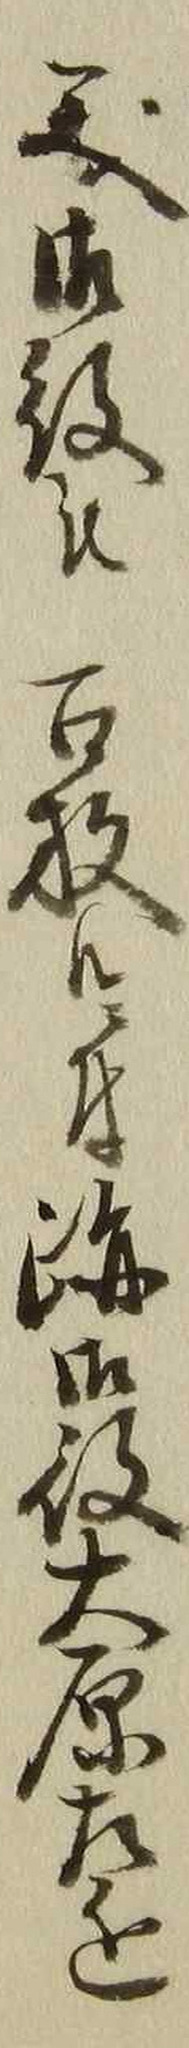義御役被召放候ニ付跡御役大原左近
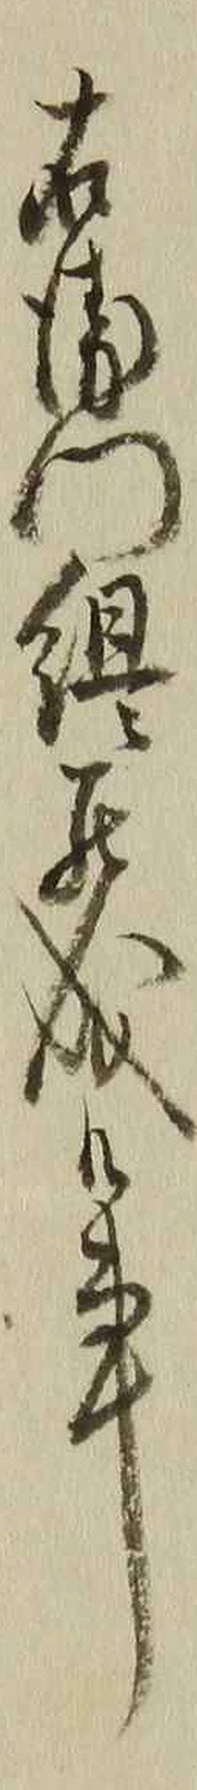右衛門組ニ罷成候事
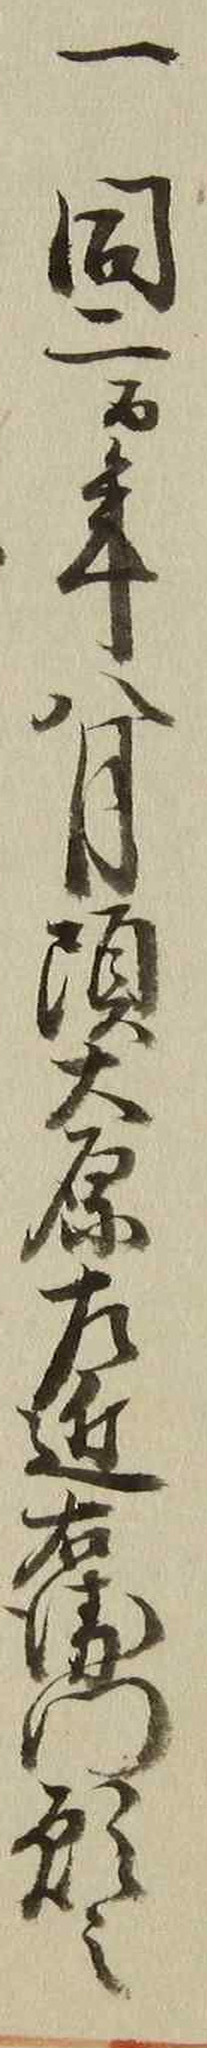一同二酉年八月頭大原左近右衛門願之
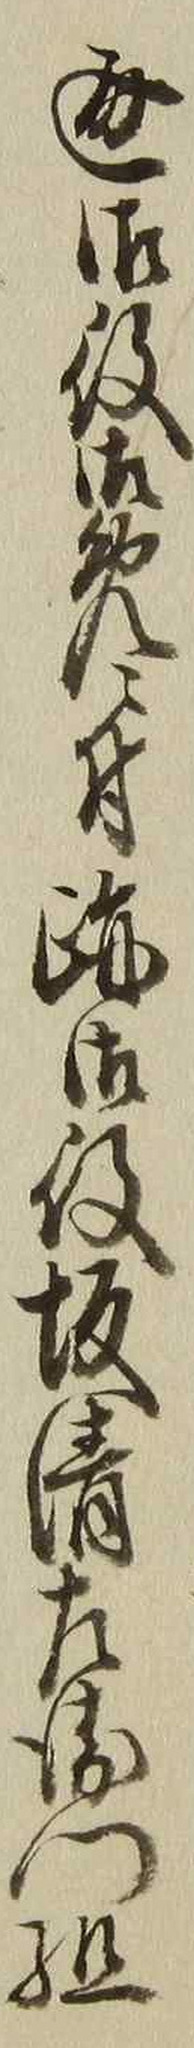通御役御免ニ付跡御役坂清左衛門組
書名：諸士系譜　巻之53　に之部4
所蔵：会津若松市立会津図書館
